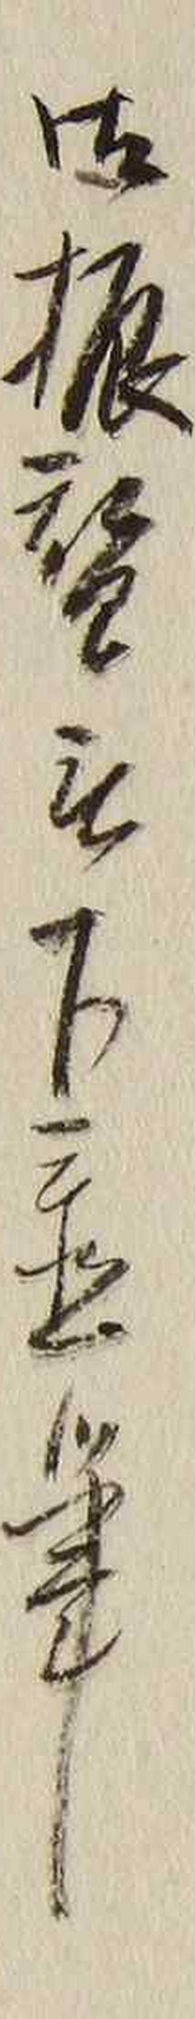御振替被下置候事

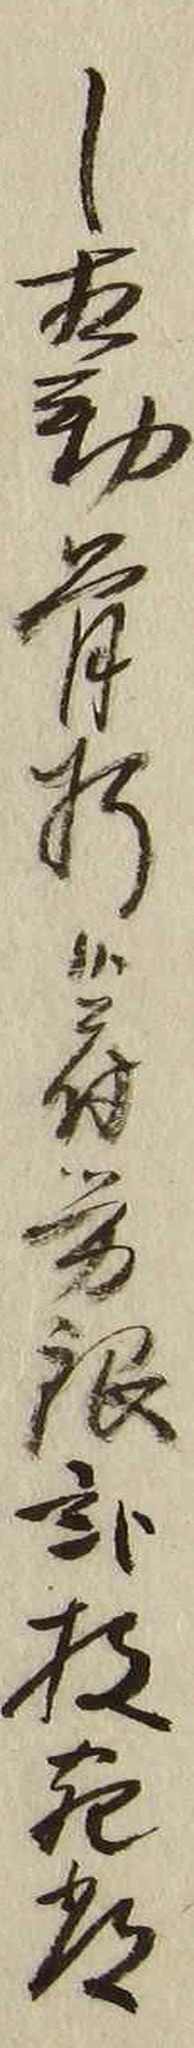し相勤骨折候ニ付労銀弐枚宛常
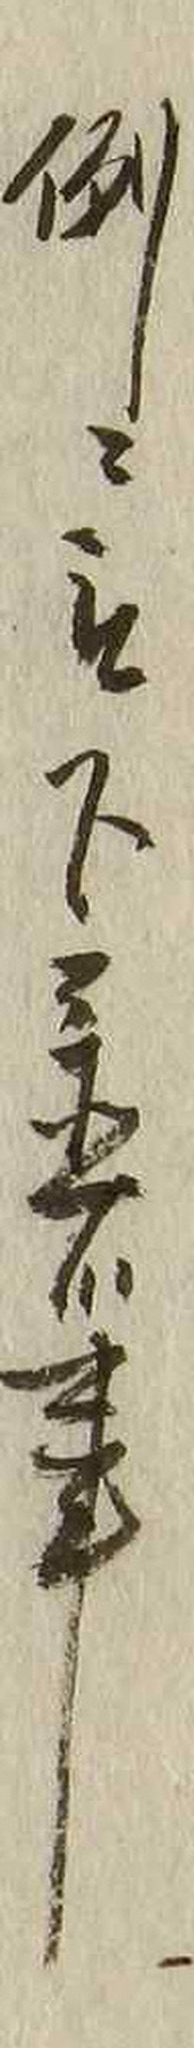例ニ被下置候事
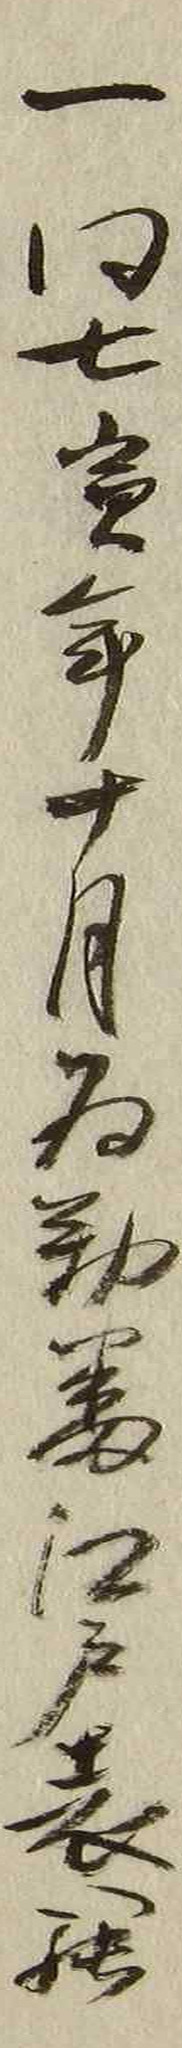一同七寅年十月為勤番江戸表へ罷
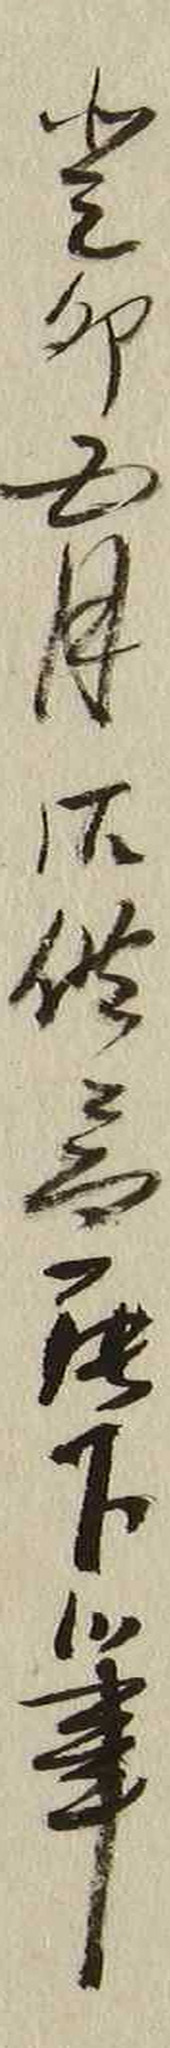登卯五月御供ニ而罷下候事
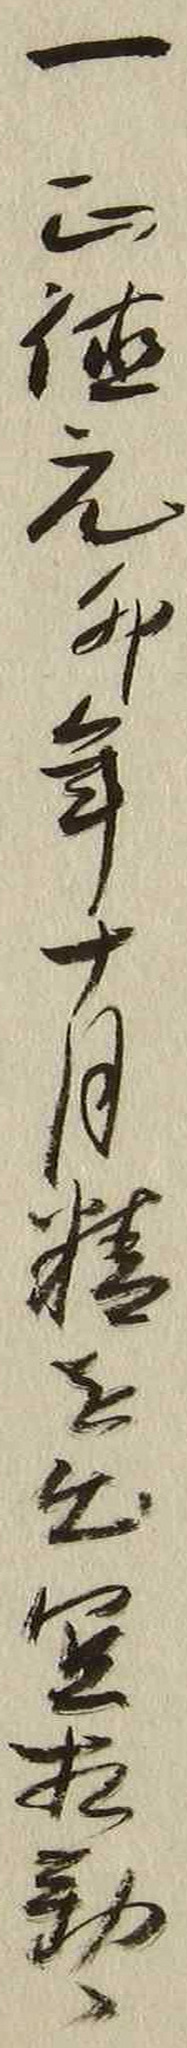一正徳元卯年十月精を出宜相勤候
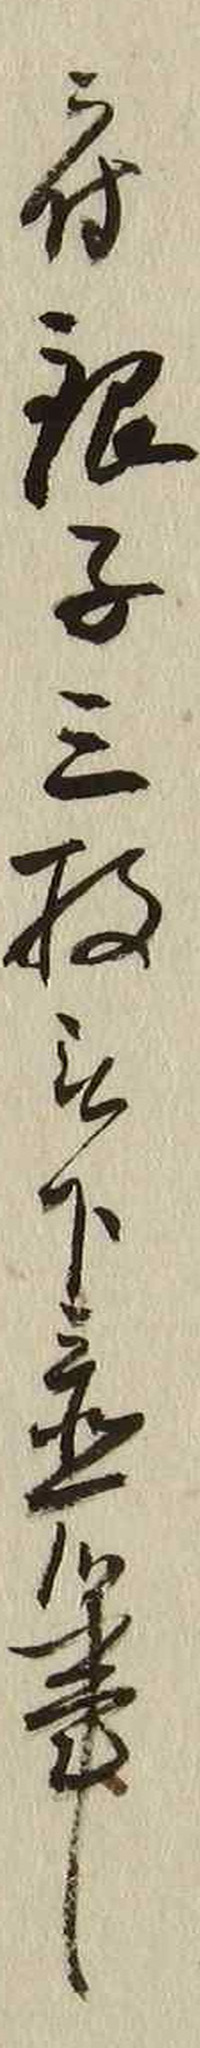ニ付銀子三枚被下置候事
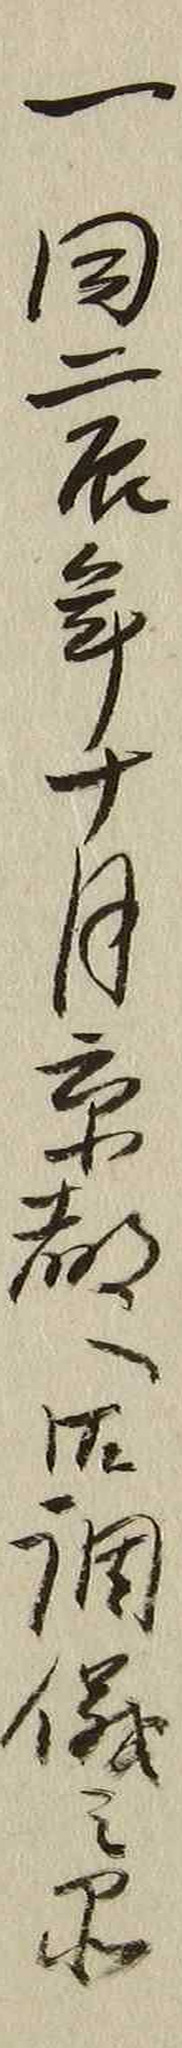一同二辰年十月京都へ御調儀之品
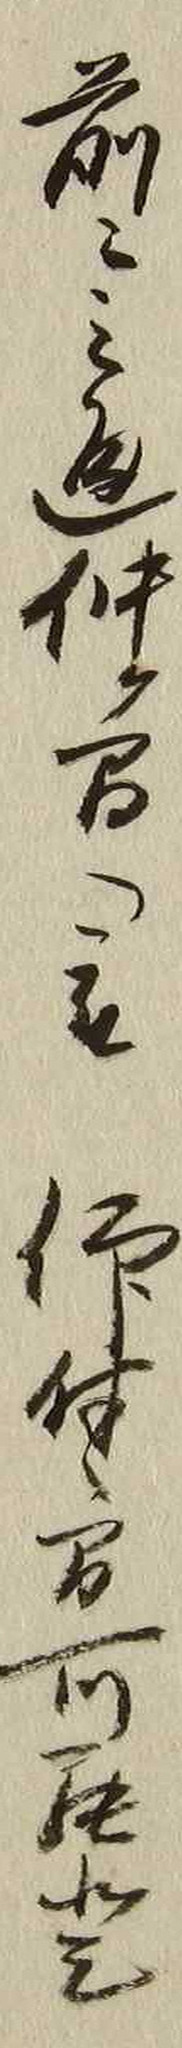前々之通仲ケ間へ被仰付候間可罷登
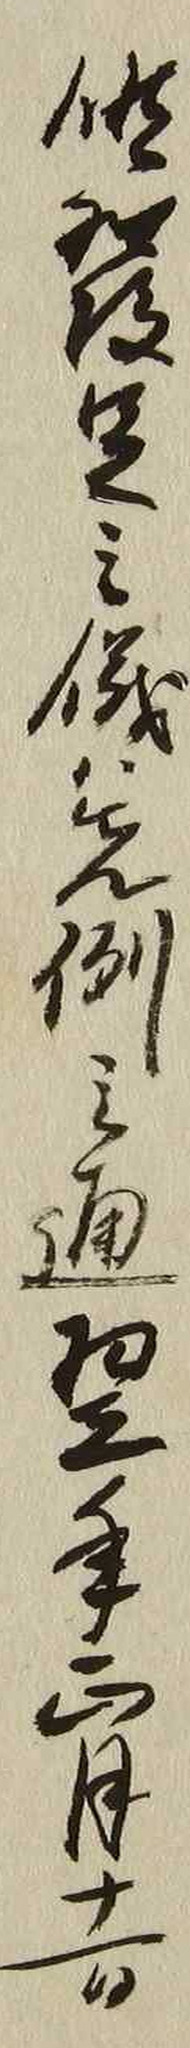候発足之儀ハ先例之通翌年正月十一日
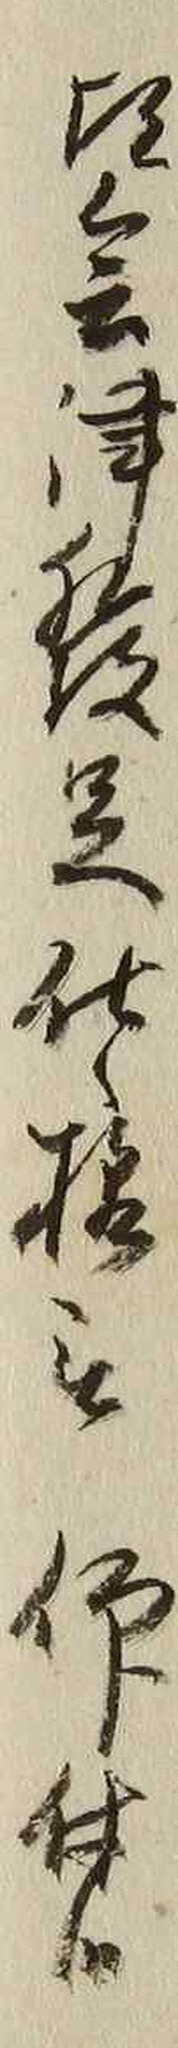頃会津発足仕候様被仰付候
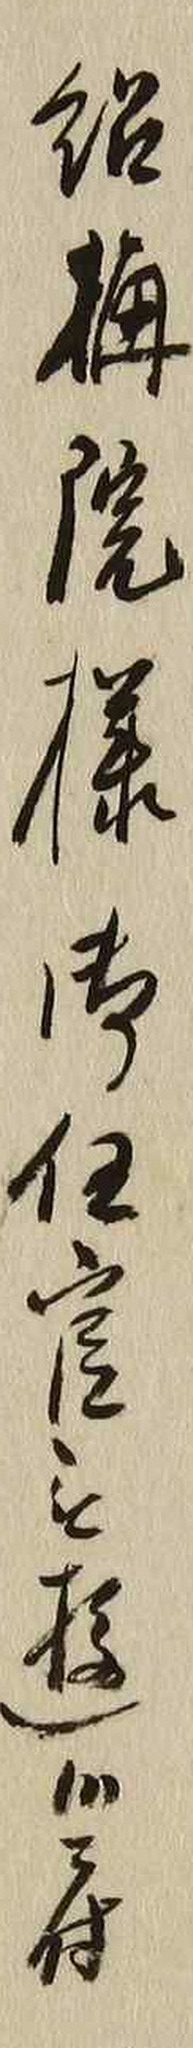紹栴院様御任官被遊候ニ付
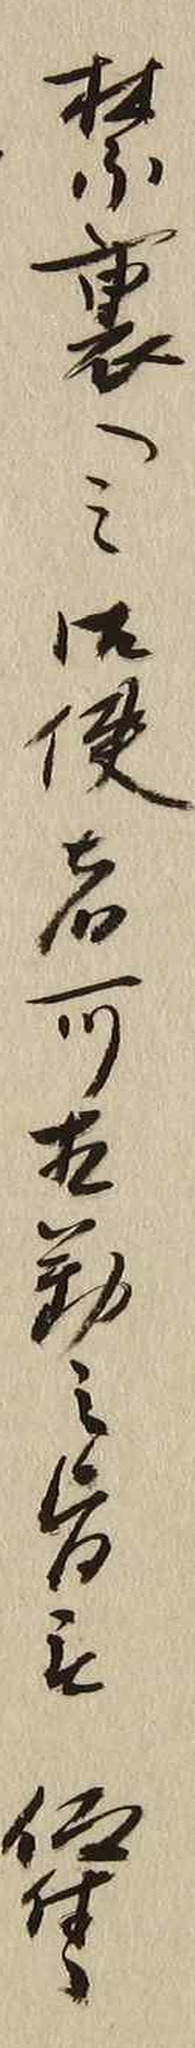禁裏へ之御使者可相勤之旨被仰付候
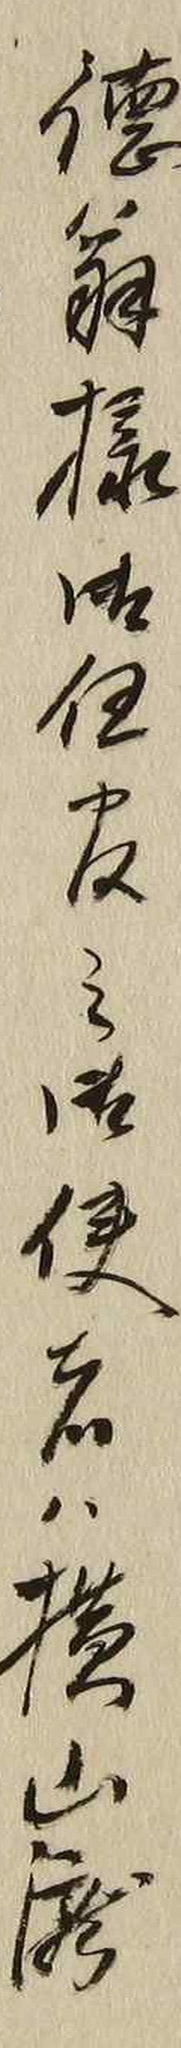徳翁様御任官之御使者ハ横山瀧
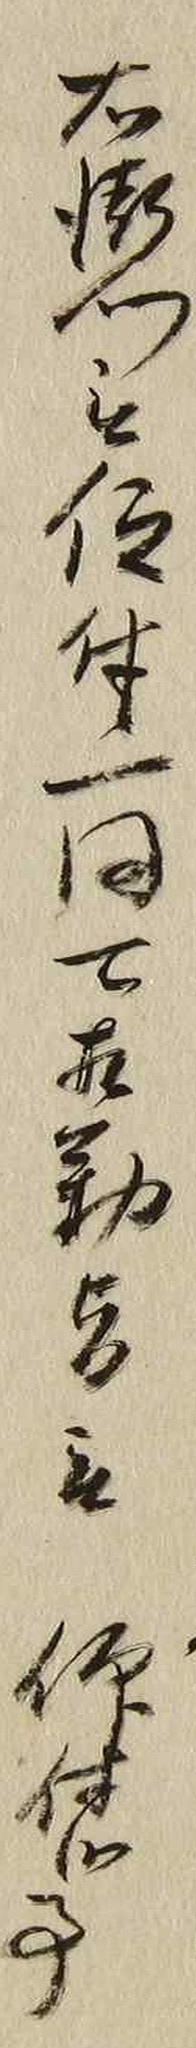右衛門被仰付一同可相勤旨被仰付候事
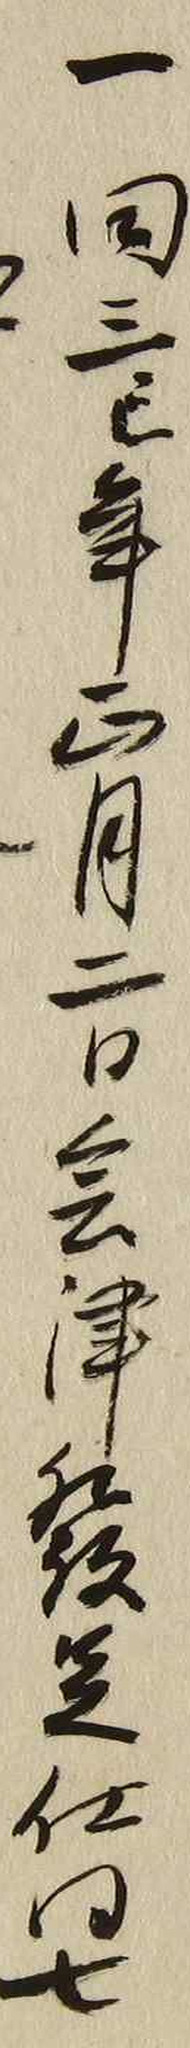一同三巳年正月二日会津発足仕同七
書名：諸士系譜　巻之346　も之部2
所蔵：会津若松市立会津図書館
